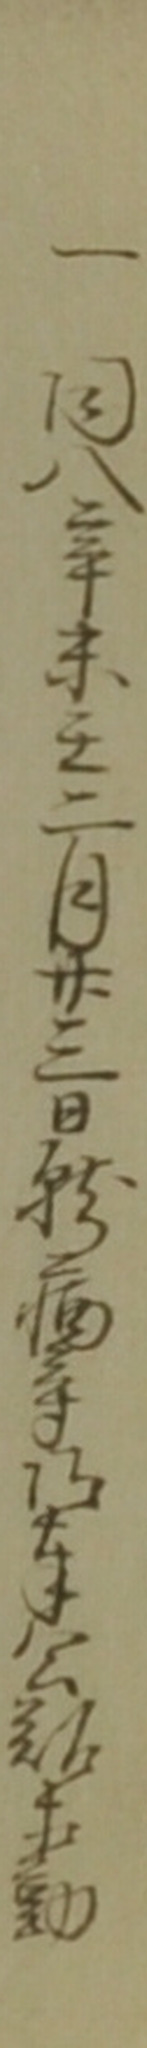一同八辛未閏二月廿三日就病気御奉公難相勤
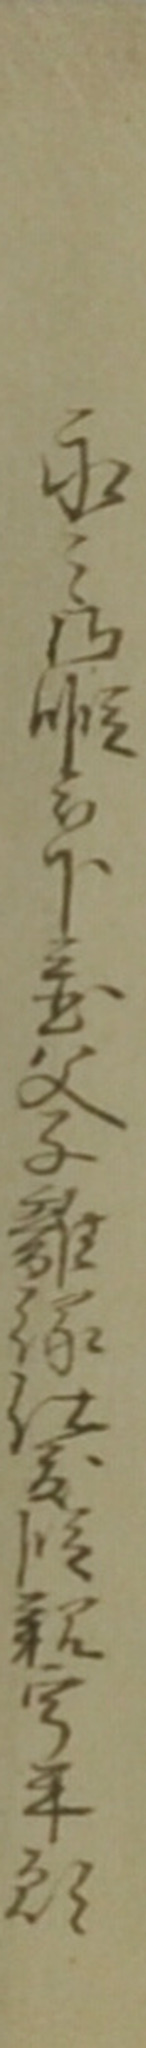永之御暇被下置父子離縁仕度段親宇平願
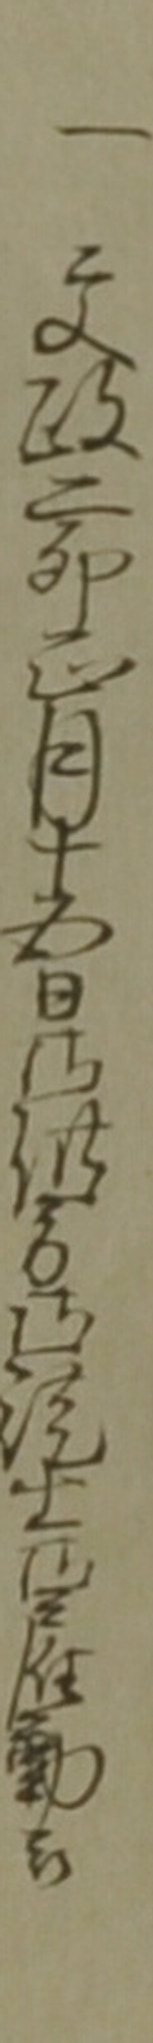一文政二卯正月十五日御供方御徒士御雇勤被
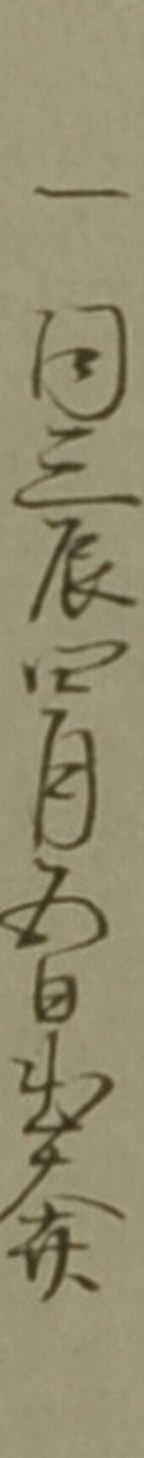一同三辰四月五日出奔
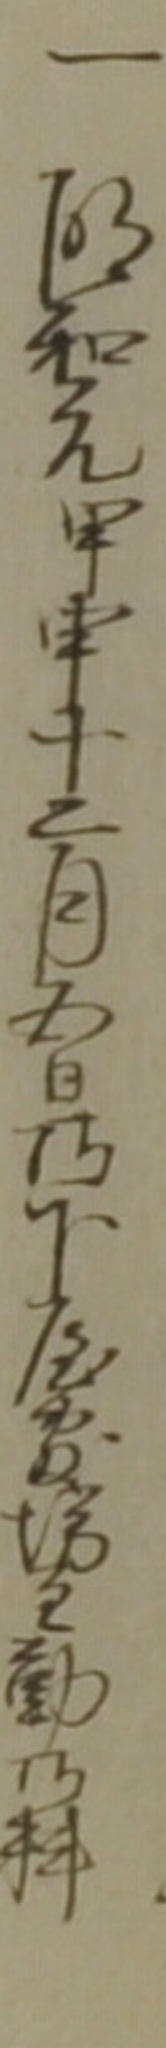一明和元甲申十二月御下屋敷坊主勤御料
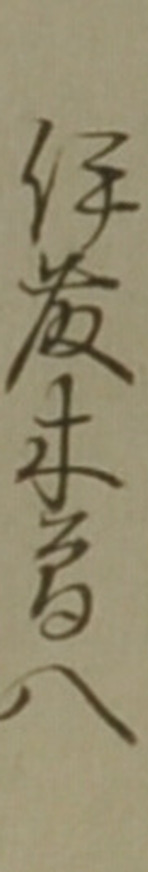伊藤木曽八
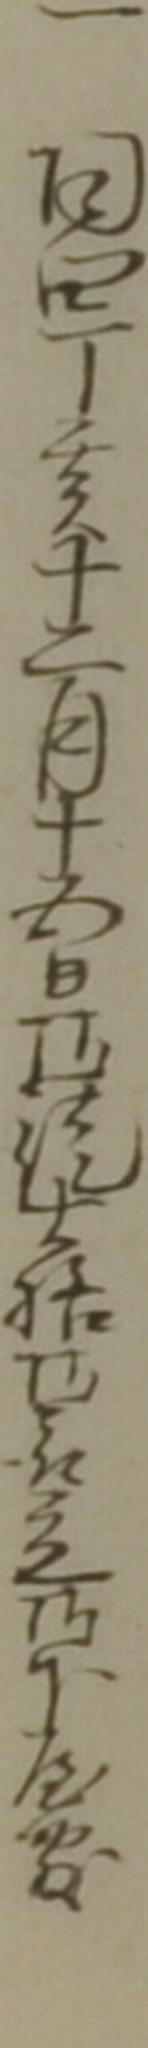一同四丁亥十二月十五日御徒士格御取立御下屋敷
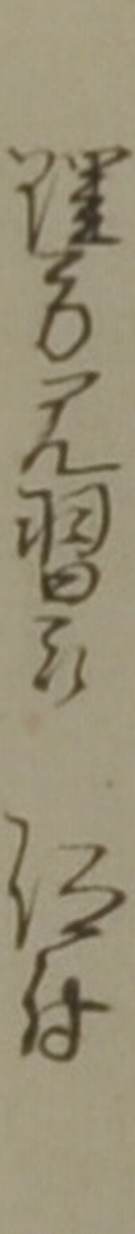理方見習被仰付
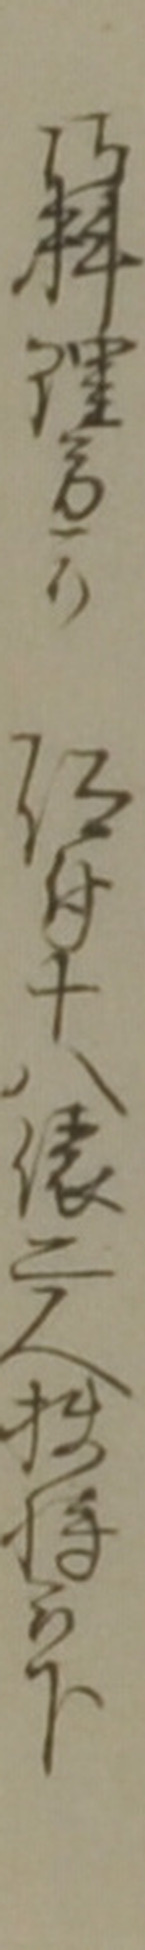御料理方被仰付十八俵二人扶持被下
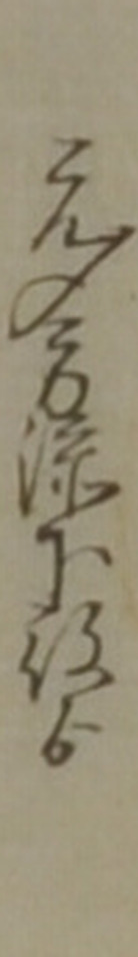元〆方添下役ゟ
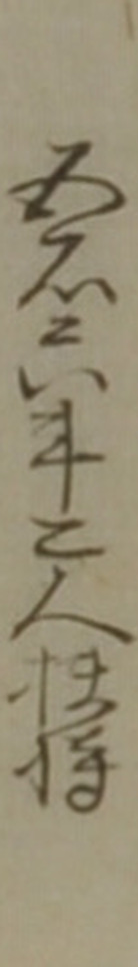五石六斗二人扶持
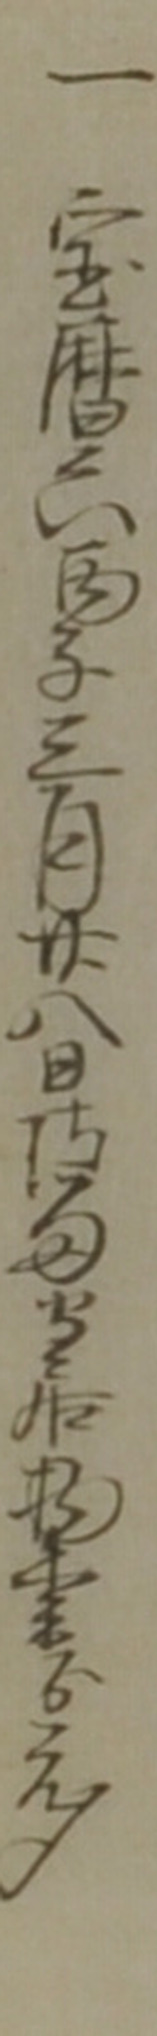一宝暦六丙子三月廿八日御留守居物書ゟ元〆
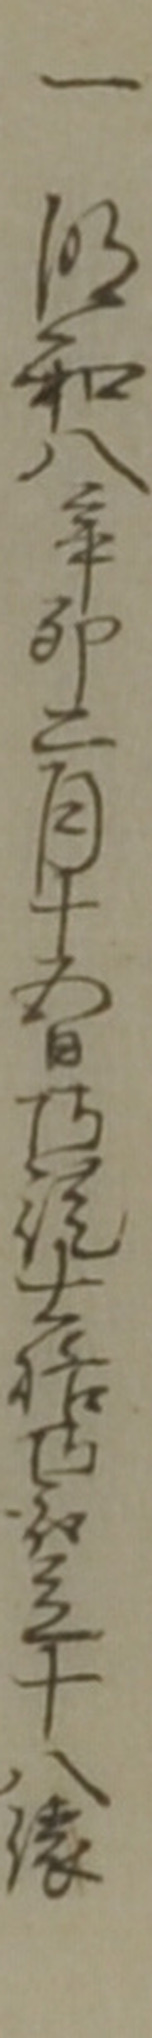一明和八辛卯二月十五日御徒士格御取立十八俵
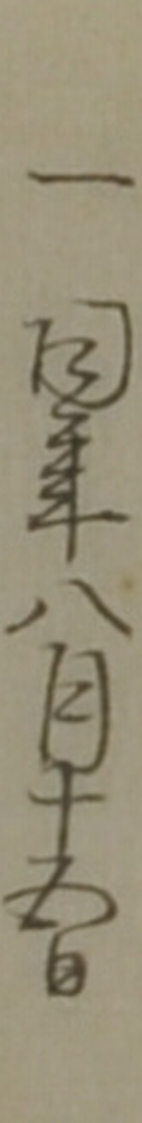一同年八月十五日
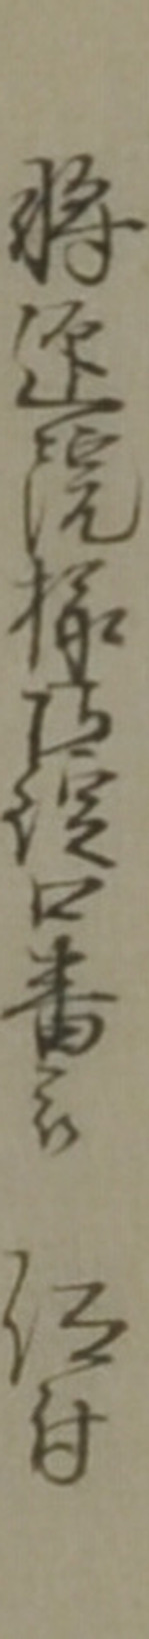将迎院様御錠口番被仰付
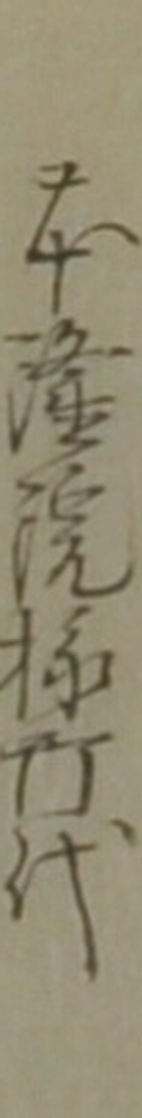本隆院様御代
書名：無足廃家（壱）
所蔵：伊那市立高遠町図書館・合同会社AMANE
